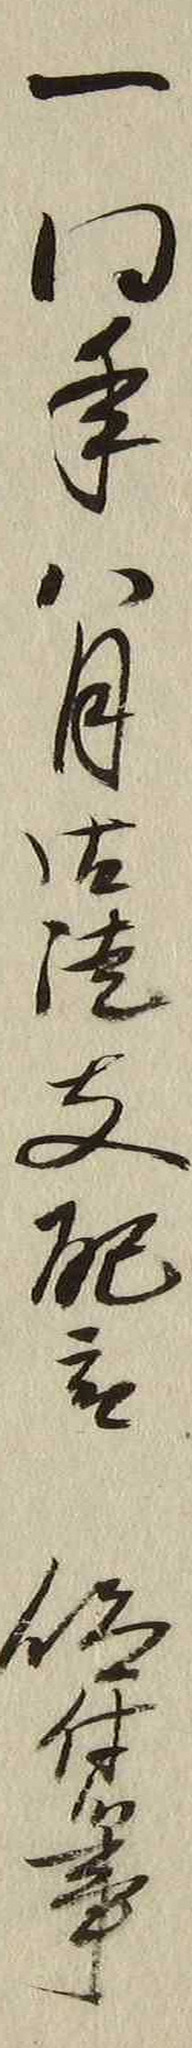一同年八月御徒支配被仰付候事
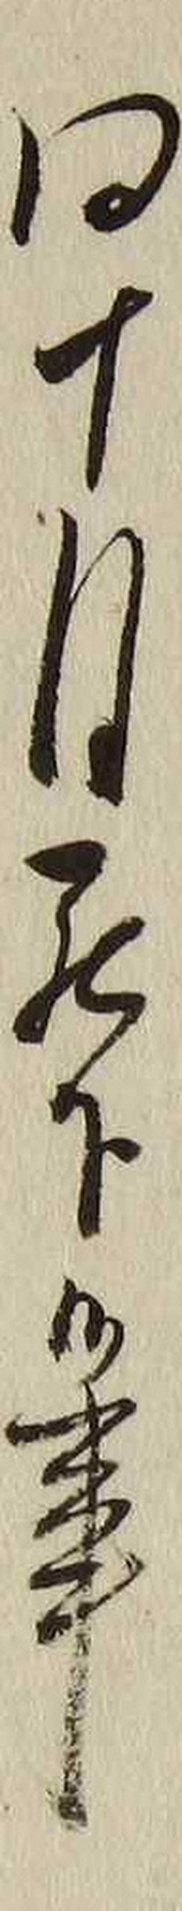同十月罷下候事
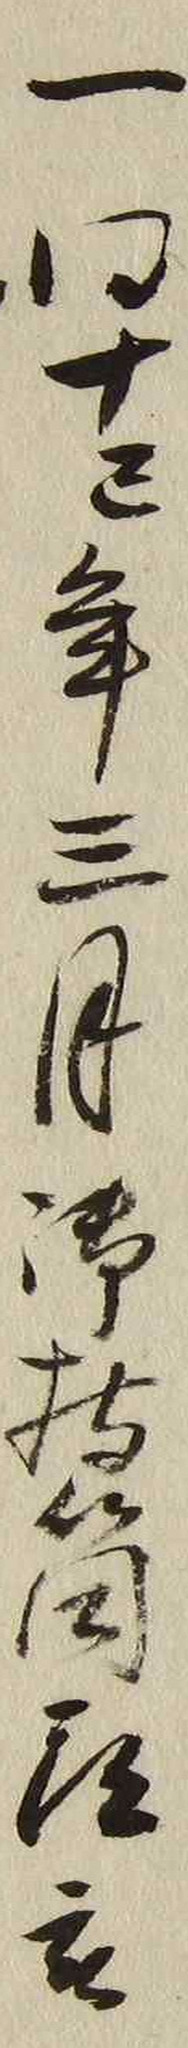一同十巳年三月御持筒頭被
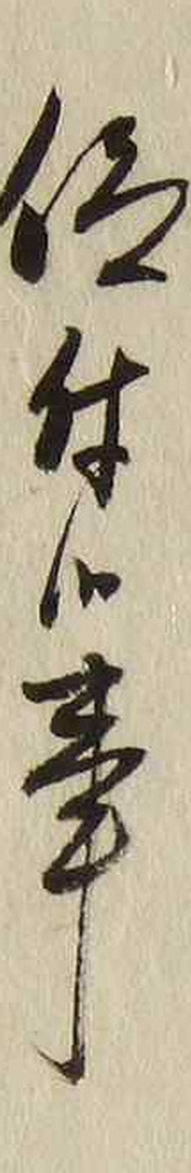仰付候事
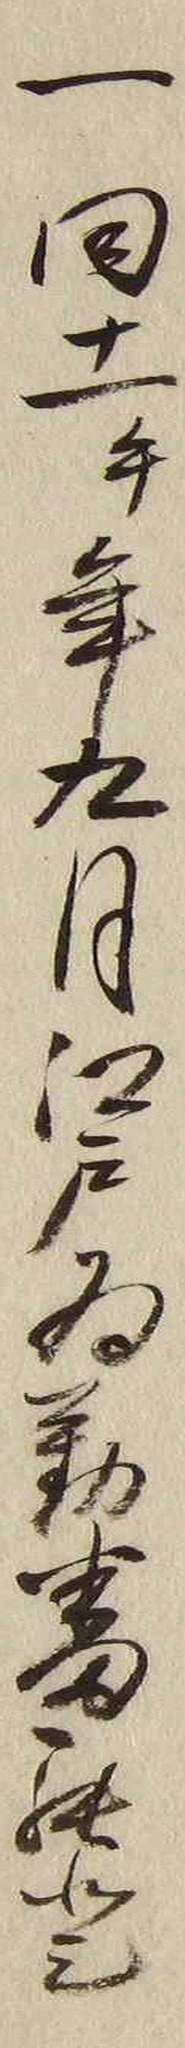一同十一午年九月江戸為勤番罷登
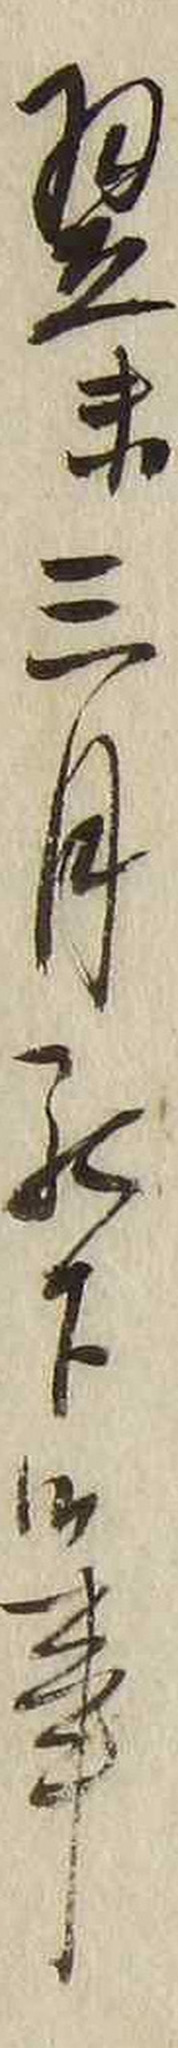翌未三月罷下候事
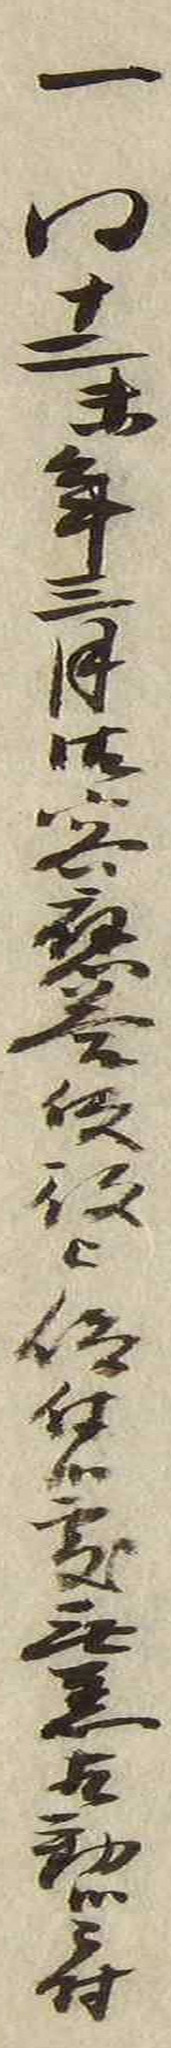一同十二未年三月御客応答仮役被仰付候処無恙相勤候ニ付

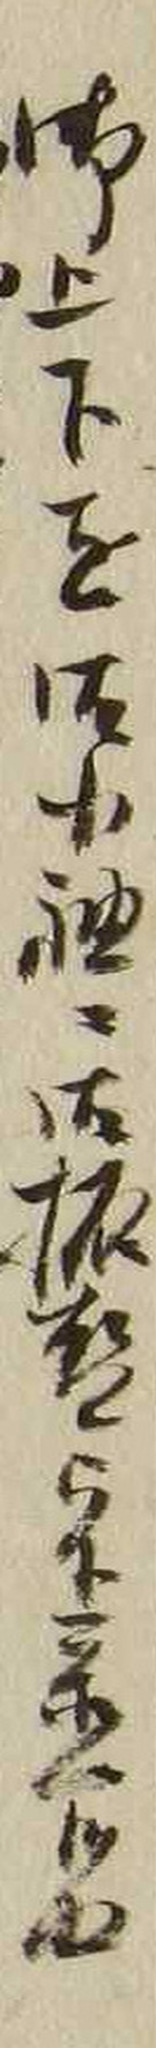御上下を御小袖ニ御振替被下置候由
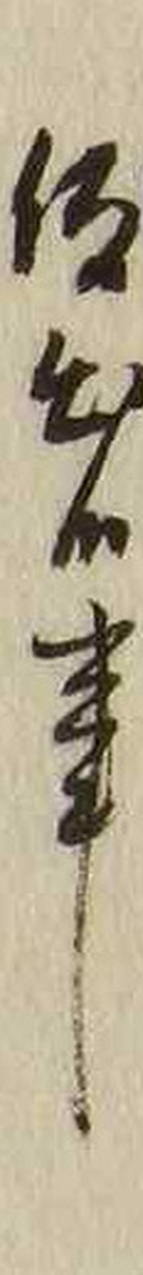仰出候事
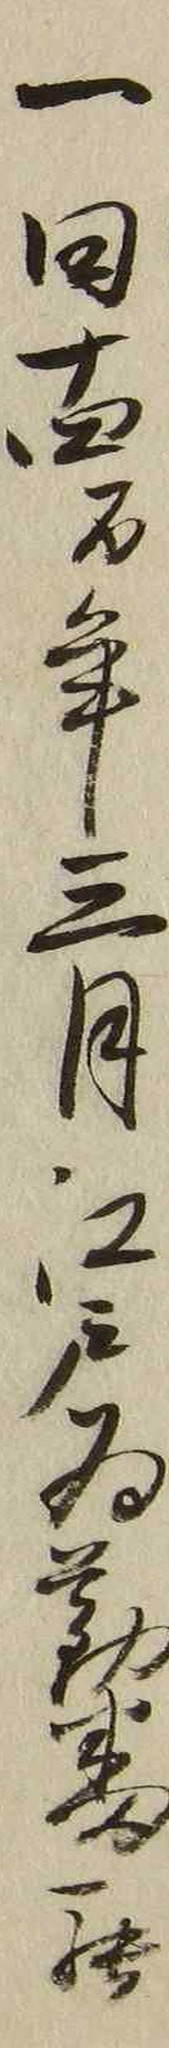一同十四酉年三月江戸為勤番罷
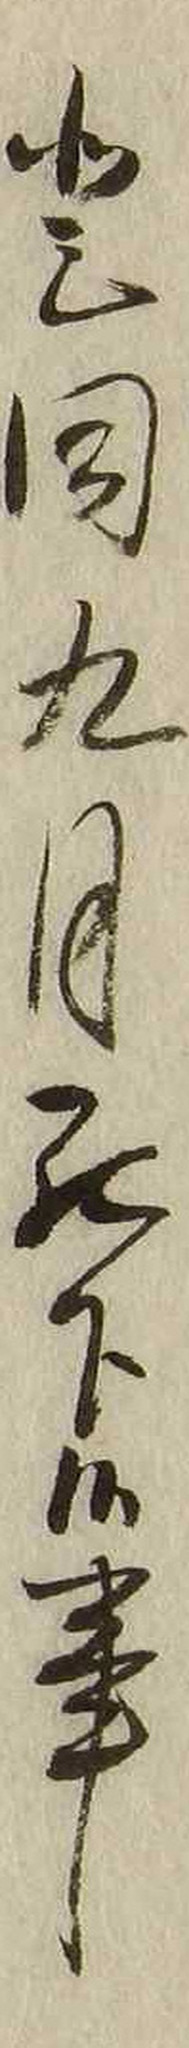登同九月罷下候事
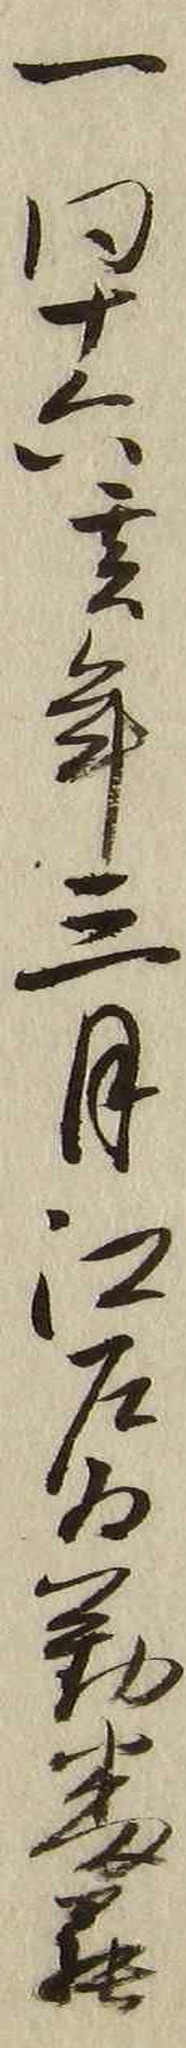一同十六亥年三月江戸為勤番罷
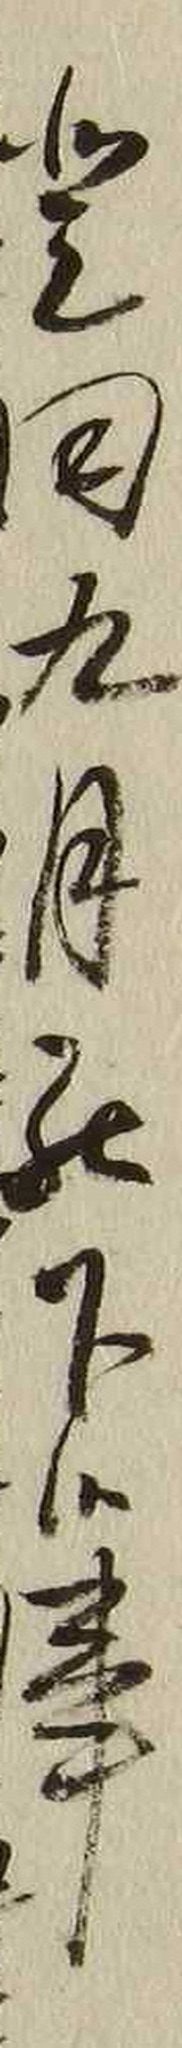登同九月罷下候事
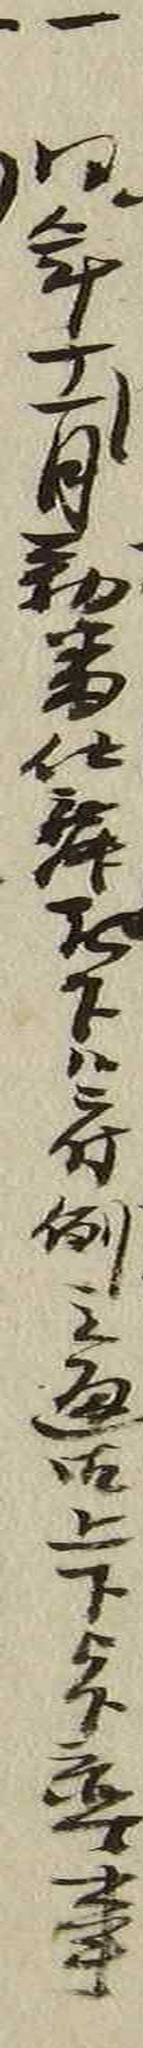一同年十一月勤番仕舞罷下候ニ付例之通御上下被下置候事
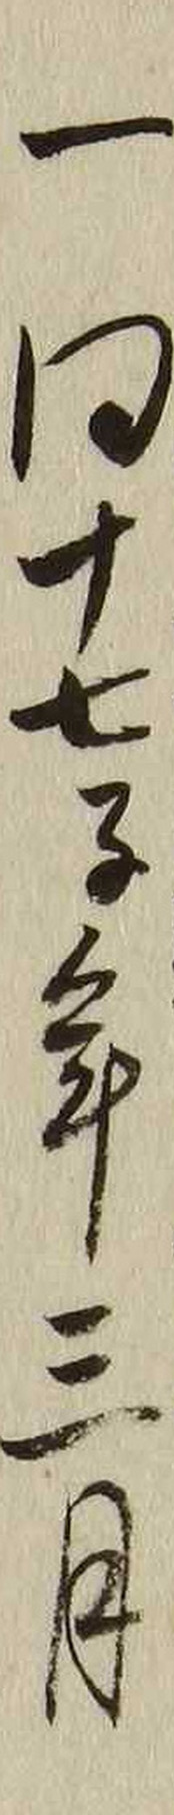一同十七子年三月
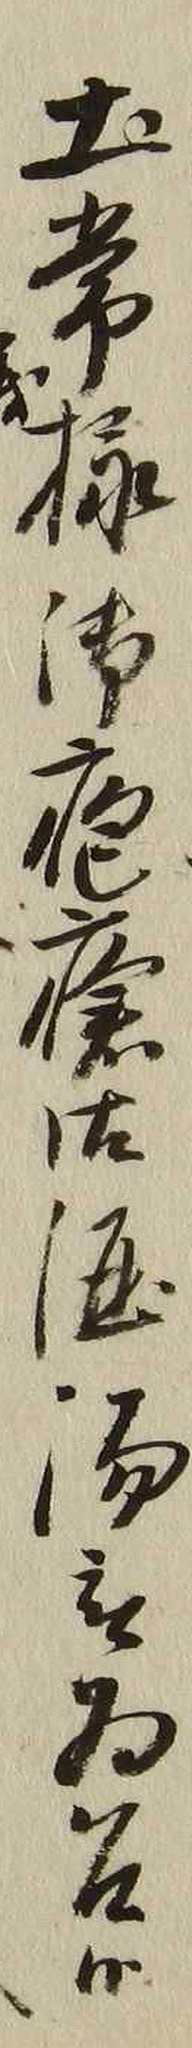土常様御庖瘡御酒湯被為召候
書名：諸士系譜　巻之355　す之部5
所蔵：会津若松市立会津図書館
